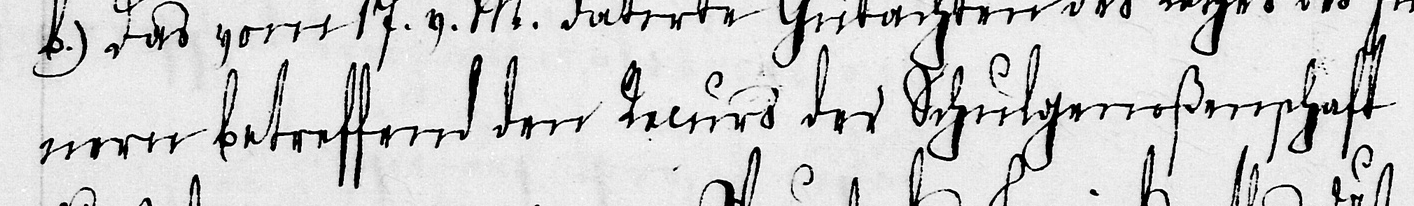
nern betreffend den Recurs der Schulgenoßenschaft
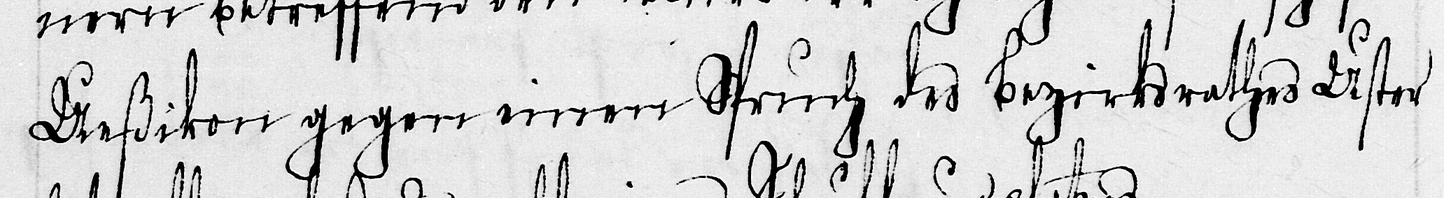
Ueßikon gegen einen Spruch des Bezirksrathes Uster
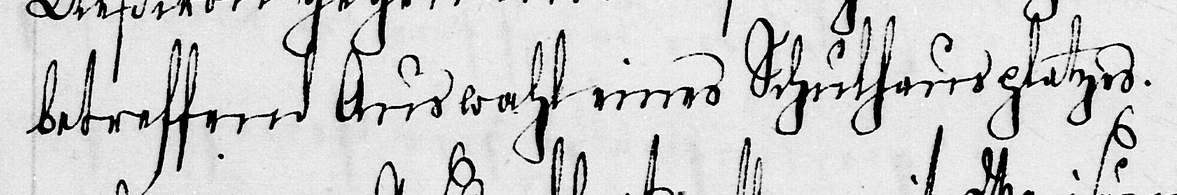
betreffend Auswahl eines Schulhausplatzes.
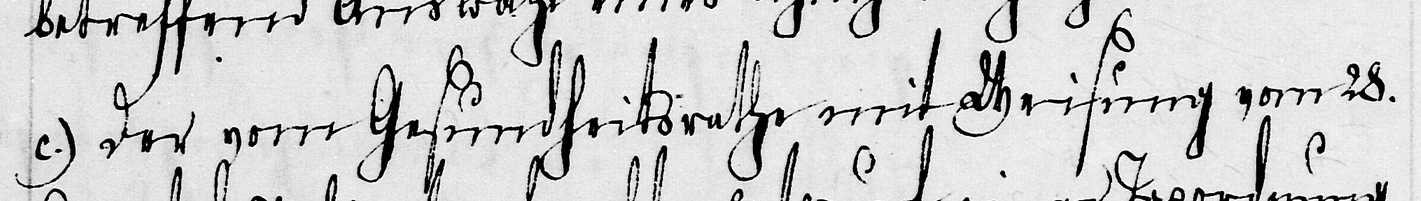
c.) Der vom Gesundheitsrathe mit Weisung vom 28.
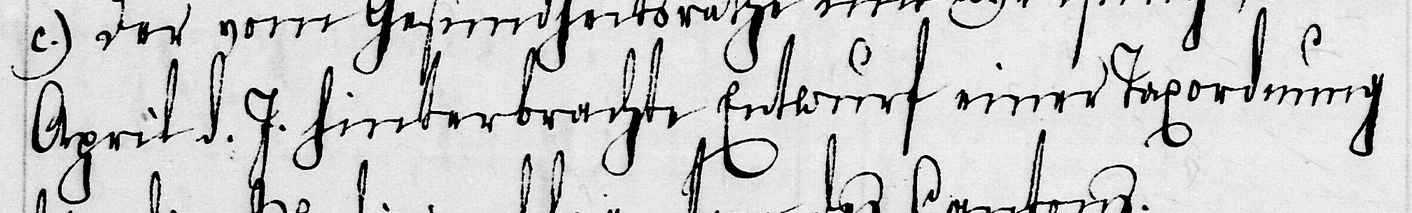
April d. J. hinterbrachte Entwurf einer Taxordnung
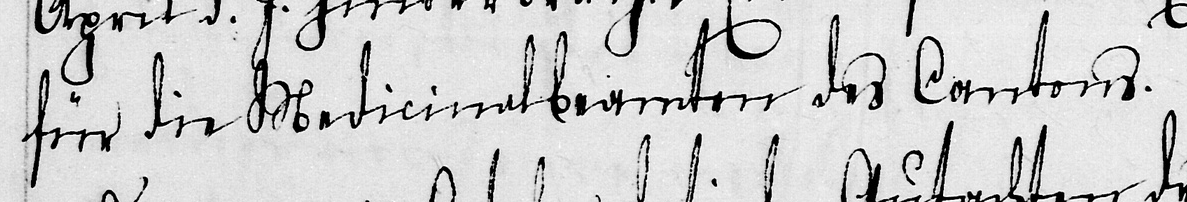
für die Medicinalbeamten des Cantons.
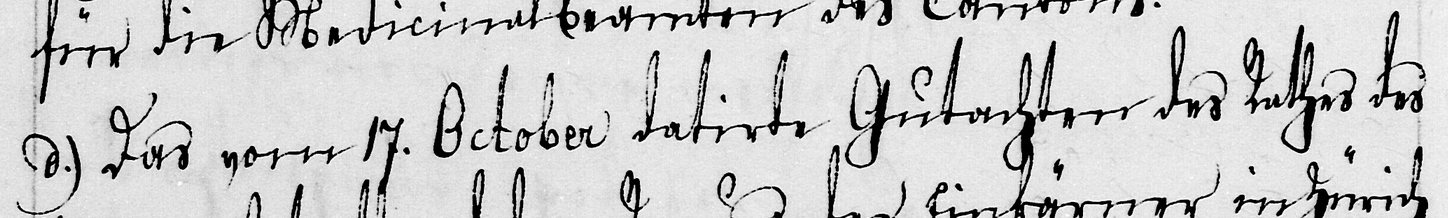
d.) Das vom 17. October datirte Gutachten des Rathes des
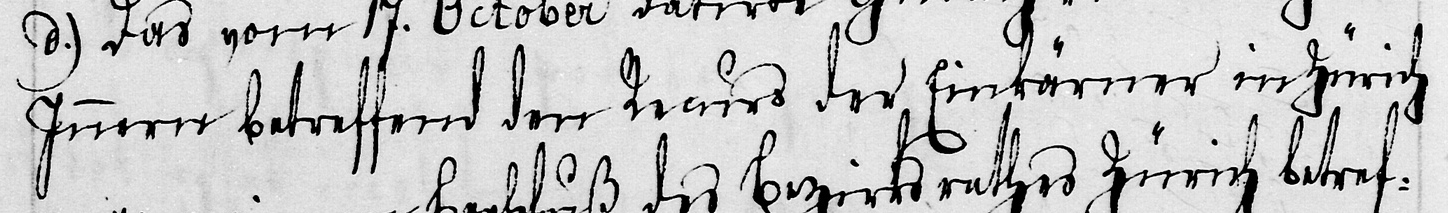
Innern betreffend den Recurs der Einkärner in Zürich
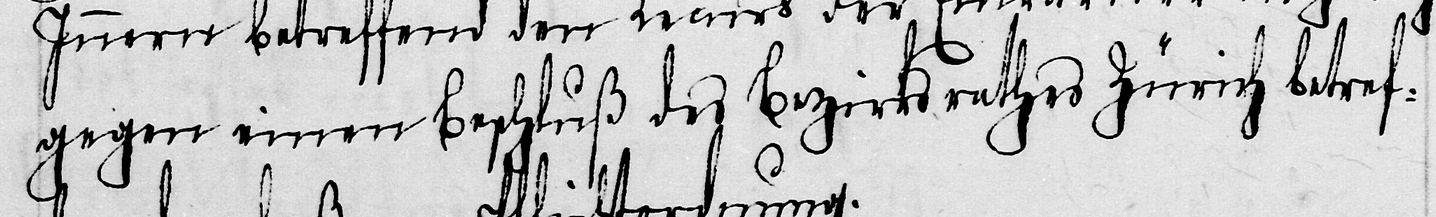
gegen einen Beschluß des Bezirksrathes Zürich betref¬
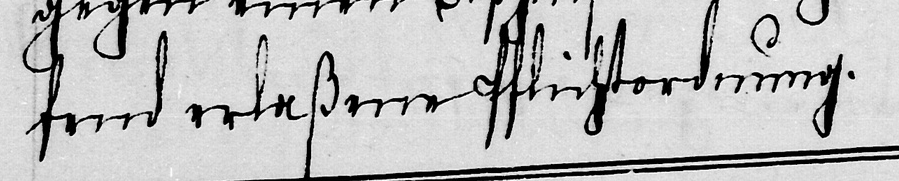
fend erlaßene Pflichtordnung.
